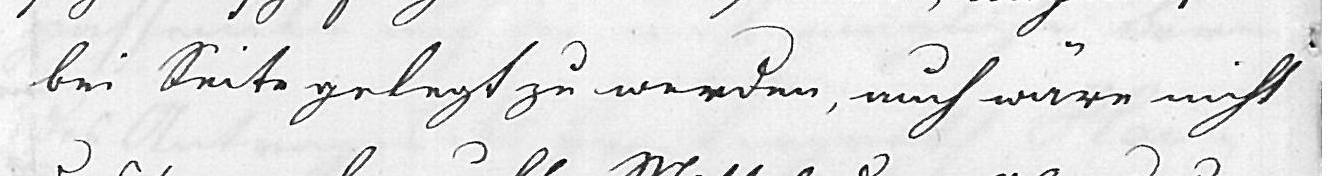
bei Seite gelegt zu werden, auch wäre nicht
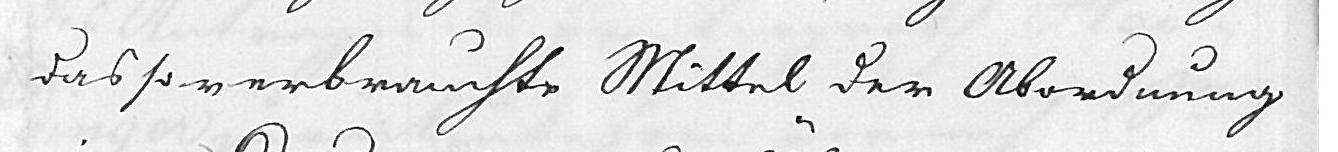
das so verbrauchte Mittel der Abordnung
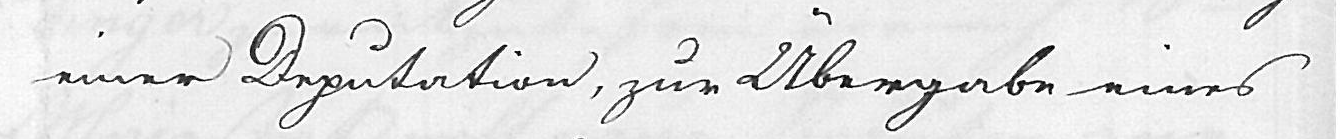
einer Deputation, zur Übergabe eines
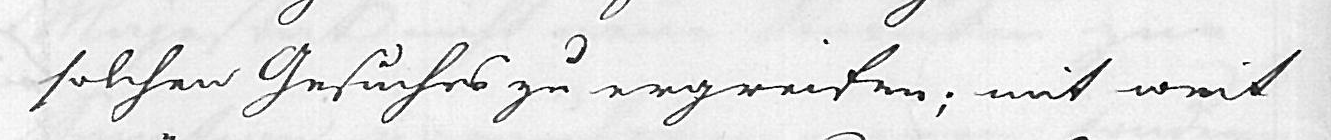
solchen Gesuche zu ergreifen, mit weit
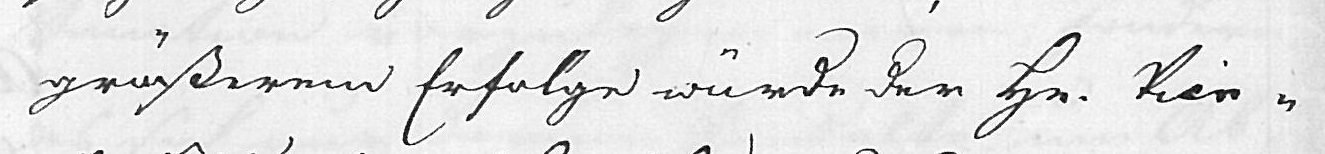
größerem Erfolge würde der Hr. Vice-
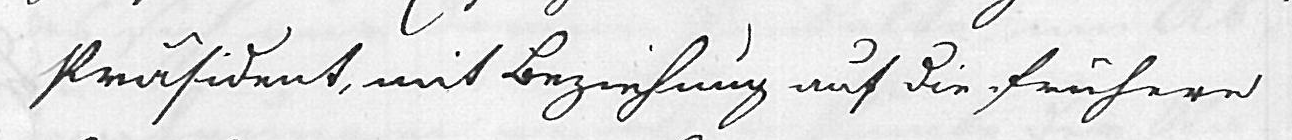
Präsident mit Beziehung auf die frühere
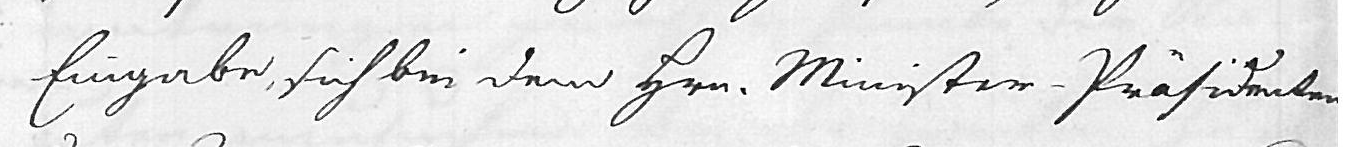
Eingabe, sich bei dem Hrn. Minister-Präsidenten
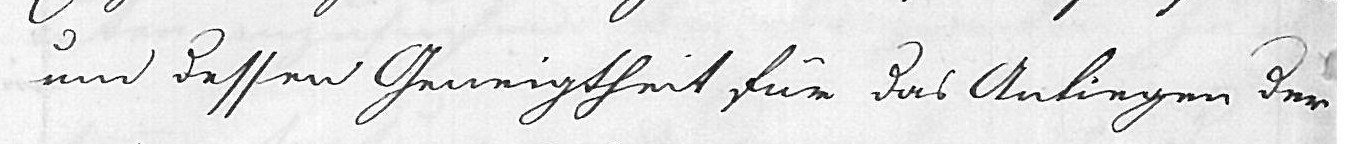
und dessen Geneigtheit für das Anliegen der
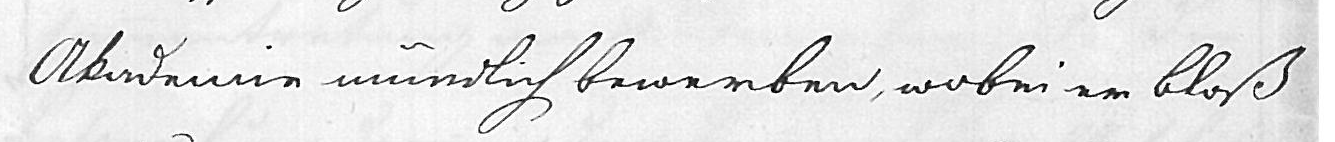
Akademie mündlich bewerken, wobei er bloß
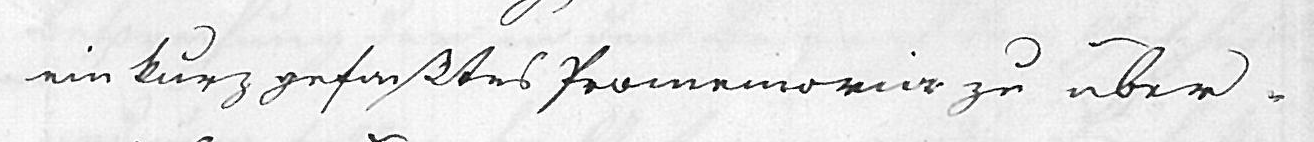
ein kurz gefaßten Promemoria zu über-
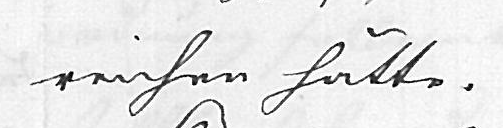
reichen hätte.
